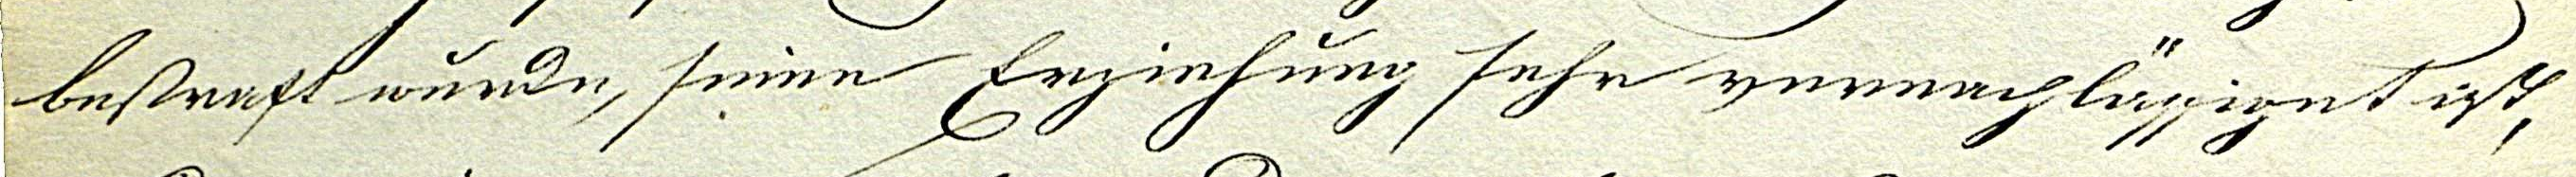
bestraft wurde, seine Erziehung sehr vernachlässiget ist,
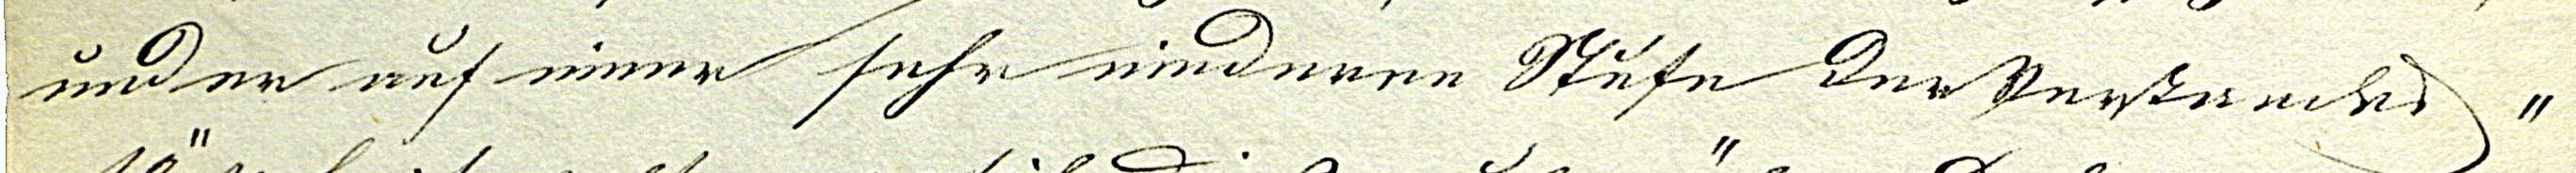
und er auf einer sehr niederen Stufe der Verstandes¬
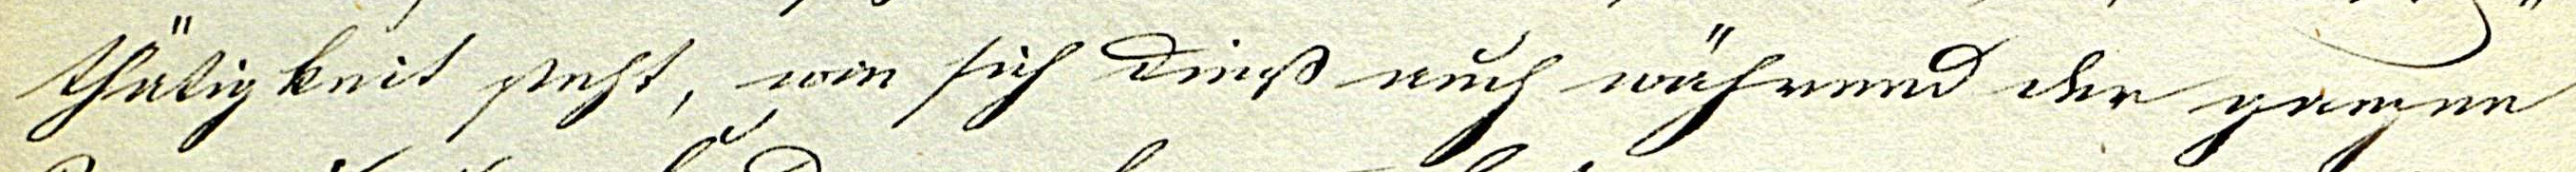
thätigkeit steht, wie sich dieß auch während der ganzen
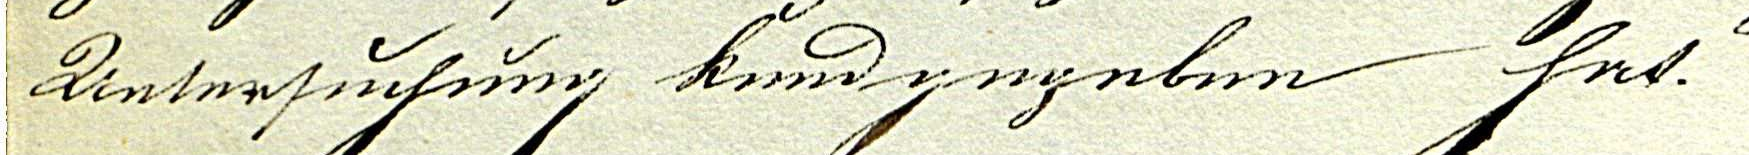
Untersuchung kundgegeben hat.
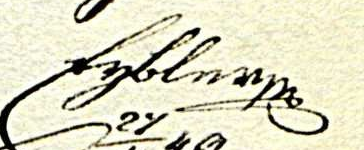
Eybler
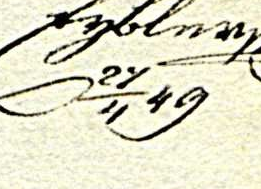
27/4 49
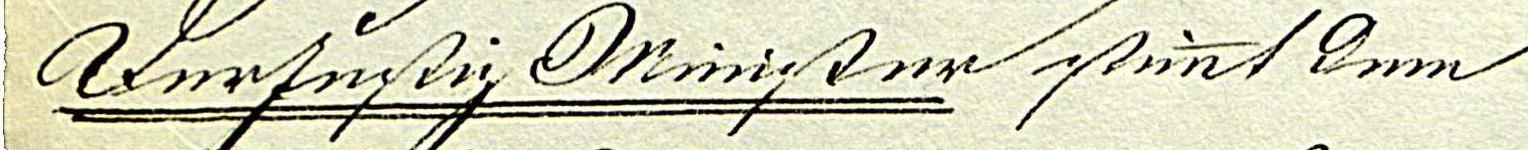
Der Justiz-Minister stimmt dem
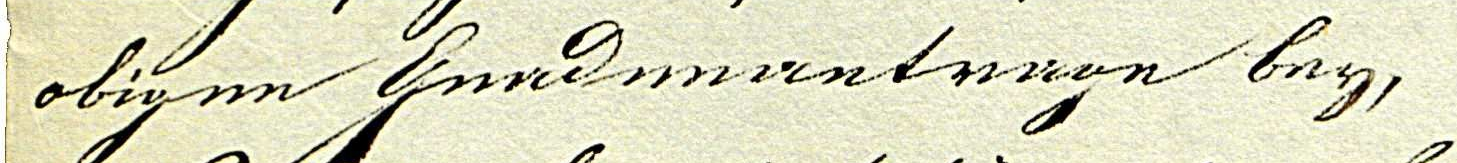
obigen Gnadenantrage bey,
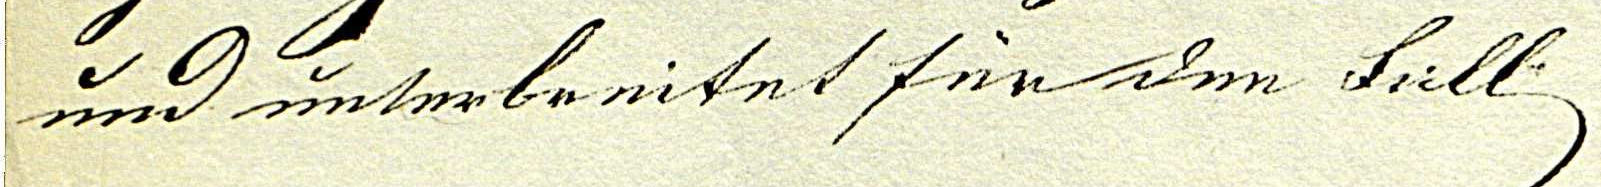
und unterbreitet für den Fall
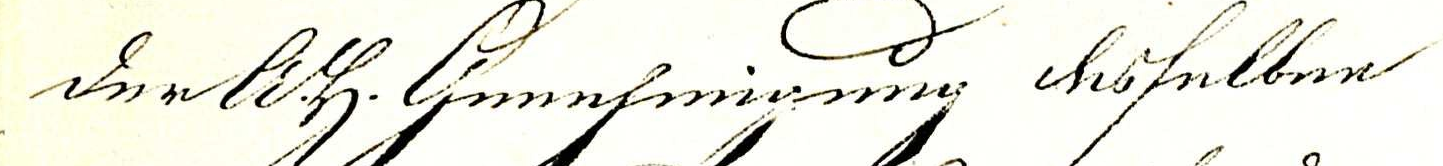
der A.H. Genehmigung desselben,
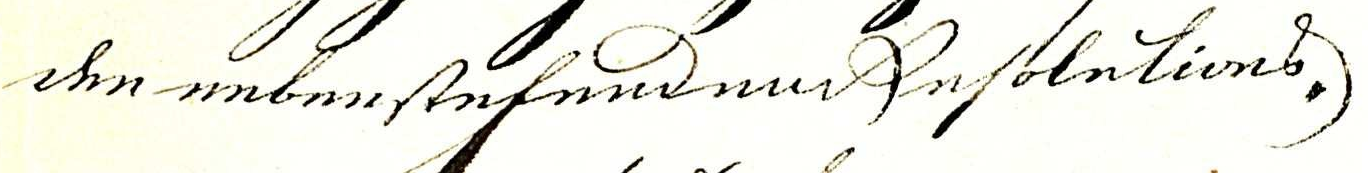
den nebenstehenden Resolutions
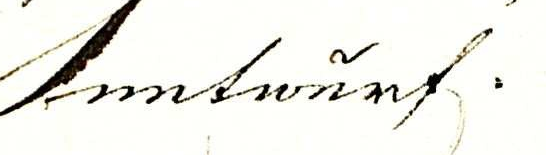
entwurf.
